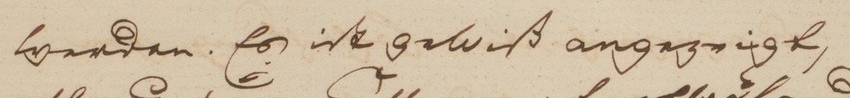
werden. Es ist gewiß angezeigt,
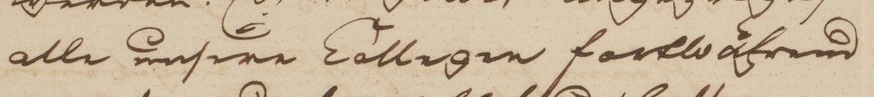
alle unsere Collegen fortwährend
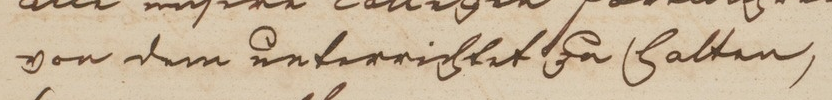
von dem unterrichtet zu halten,
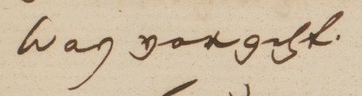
was vorgeht.
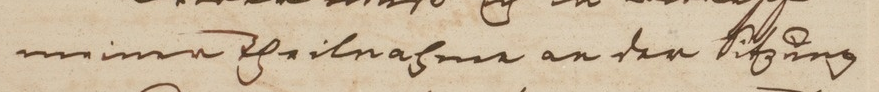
meiner Theilnahmen an der Sitzung
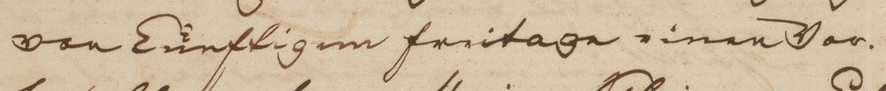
von künftige Freitage einen Vor-
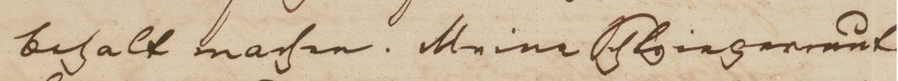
behalt machen. Meine Schwiegermut-
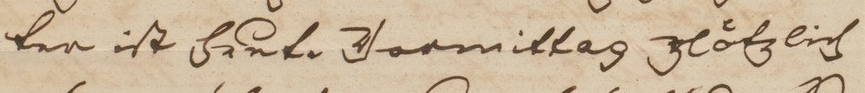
ter ist heute Vormittag plötzlich
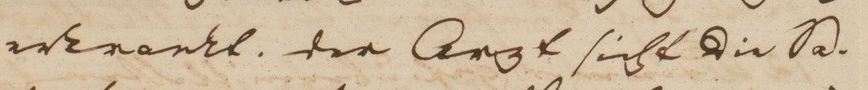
erkrankt. Der Arzt sieht die Sa-
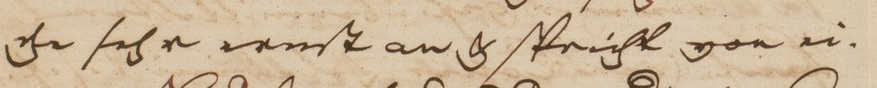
che sehr ernst an & spricht von ei-
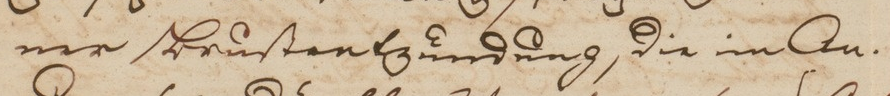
ner Brustentzündung, die im An-
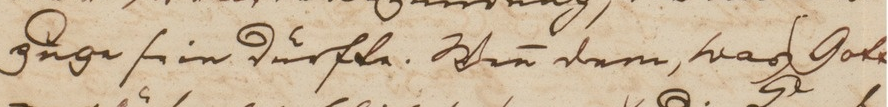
zuge sein dürfte. Wenn dem, was Gott
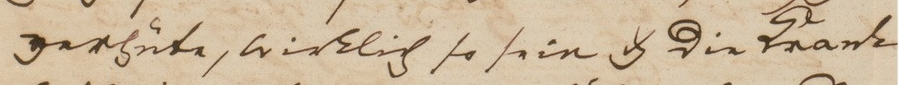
verhüte, wirklich so sein & die Krank-
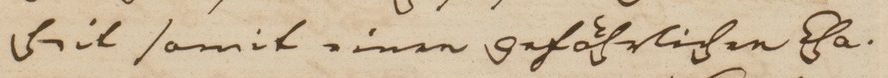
heit somit einen gefährlichen Cha-
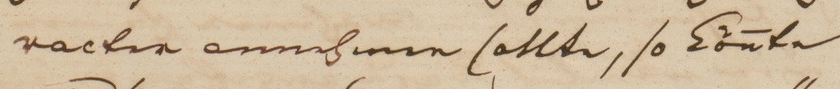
racter annehmen sollte, so könnte
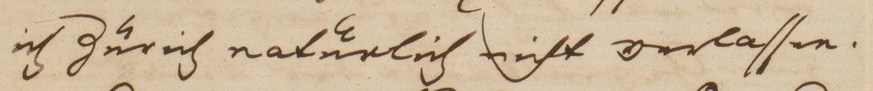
ich Zürich natürlich nicht verlassen.
